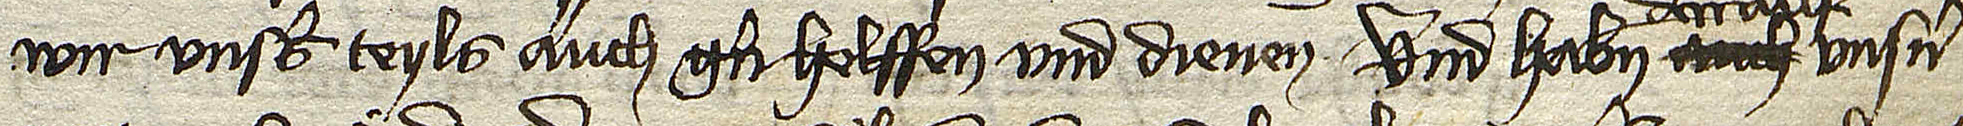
wir vnſ*s teyls auch g*n helffen vnd dienen / Vnd habn* auch vnſn*
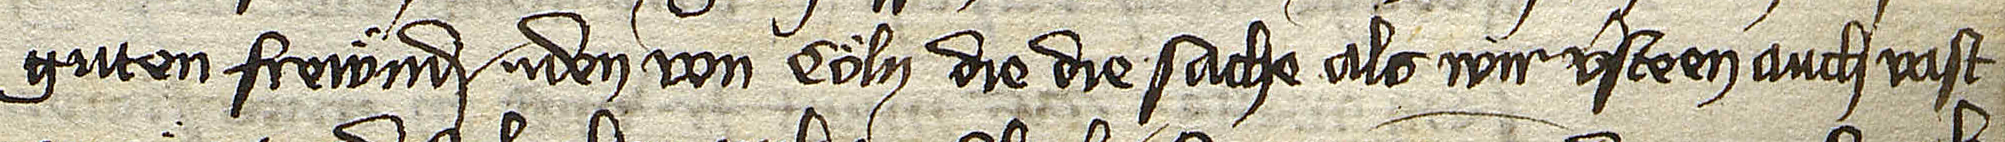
guten freẅnd* / ~ den von Cöln die die ſache als wir v*ſteen auch vaſt
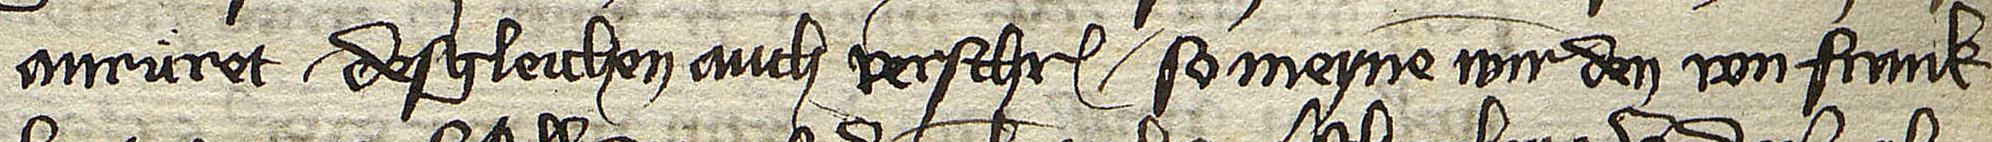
anrüret / Deſgleichen auch verſchr* / ſo meyne* wir den von frank
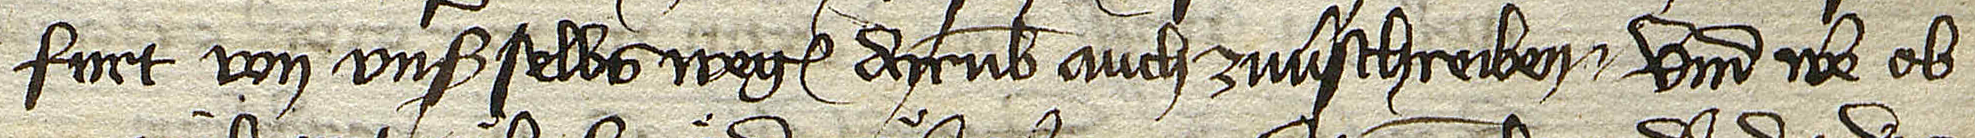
furt von vnſ* ſelbs weg* darub* auch ʒuu*ſchreiben / Vnd w*e ob
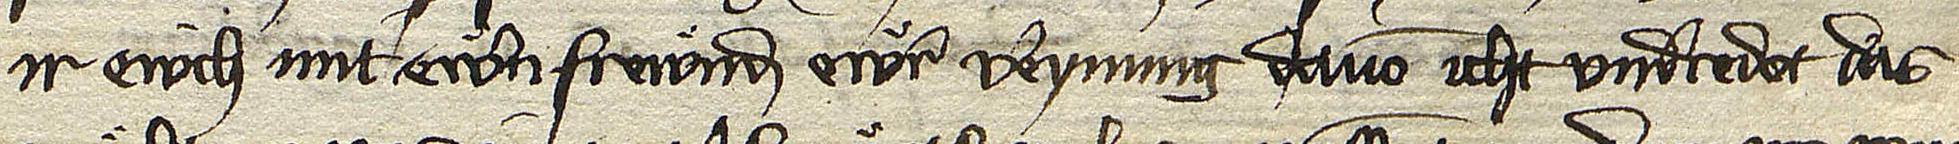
ir eẅch mit / eẅ*n freẅnd* eẅr* v*eynung dauo* icht vnd*redet das
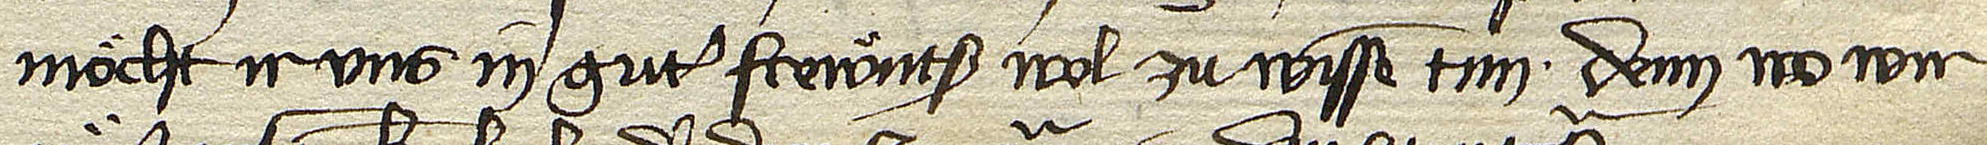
möcht ir vns in gut* freẅntſ* wol ʒu wiſſe* tun . Denn wo wir
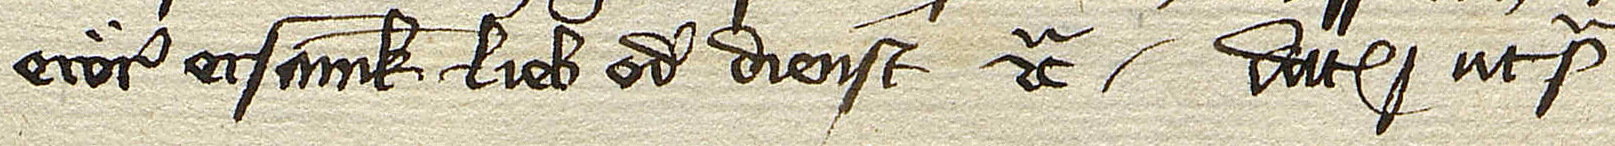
eẅr* erſamk* lieb od* dienſt ec* / Dat* ſ ut ſ*
